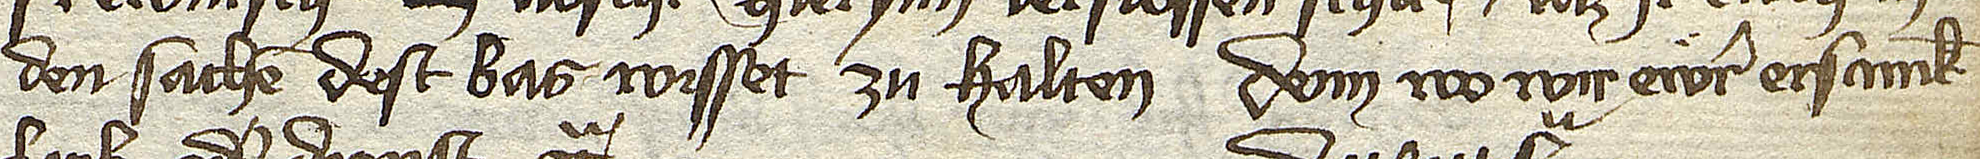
den ſache* deſt bas wiſſet ʒu halten Denn wo wir eẅr* erſamk*
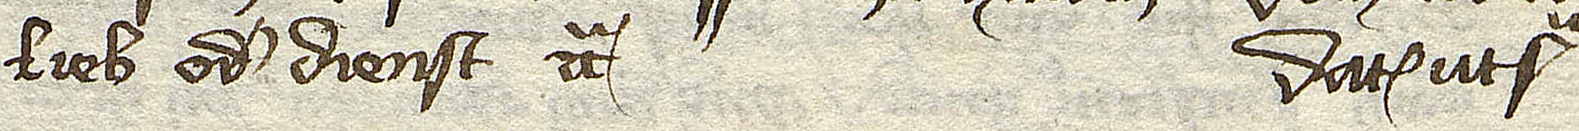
lieb od* dienſt ec* Dat* ut ſ*
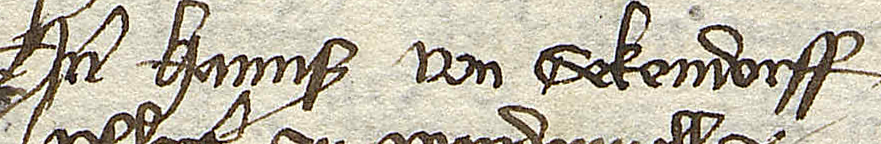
Hn* Hannſ* von Sekendorff
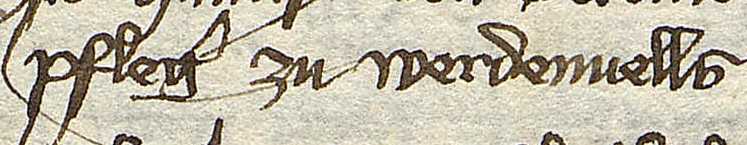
pfleg* ʒu werdenuells
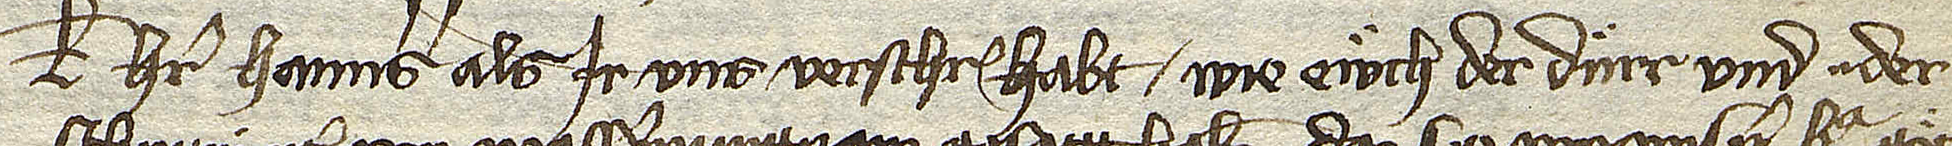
L* hr* hanns als Ir vns verſchr* habt / wie eẅch der dürr vnd ~ der
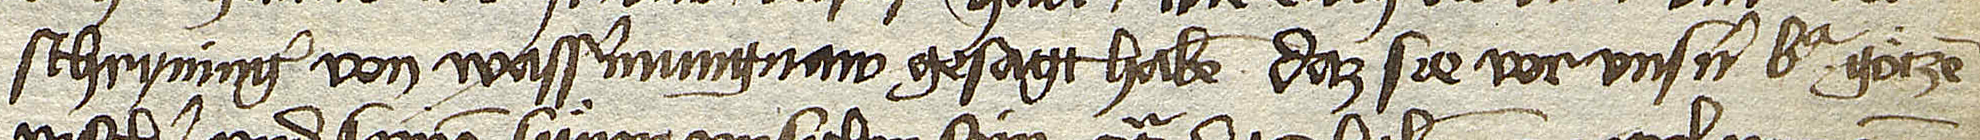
ſchryning* von waſſ*mungnaw geſagt habe* daʒ ſie vor vnſn* b* göcʒe*
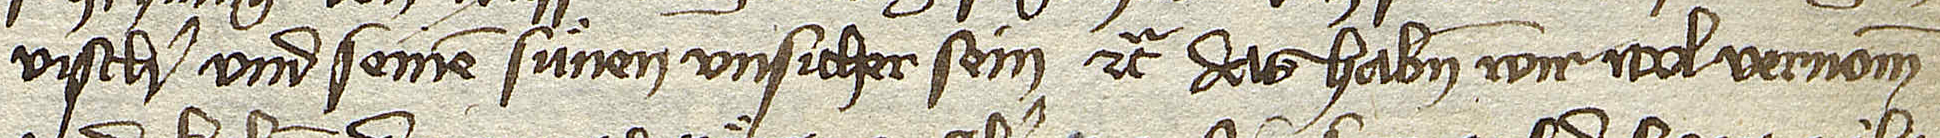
viſch* vnd ſeine* ſünen vnſicher ſein ec* das habn* wir wol vernom*
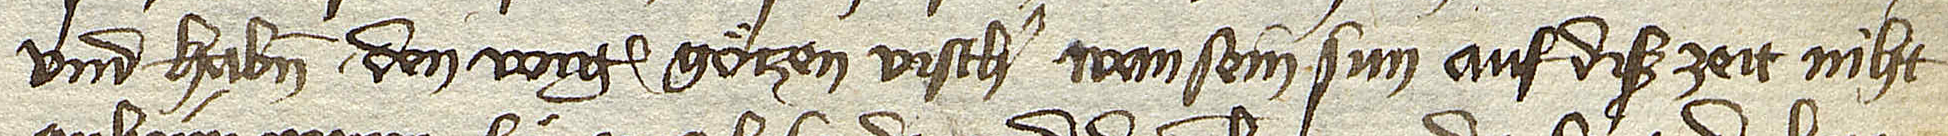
vnd habn* / den vorg* göcʒen viſch* wan ſein ſun auf diſʒ ʒeit niht
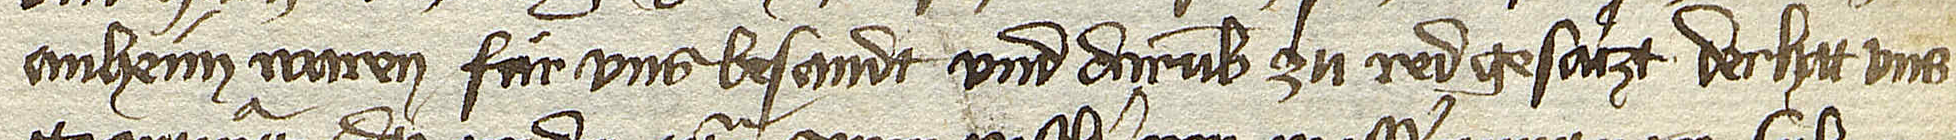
anheim waren für vns beſandt vnd darub* ʒu red geſacʒt der hat vns
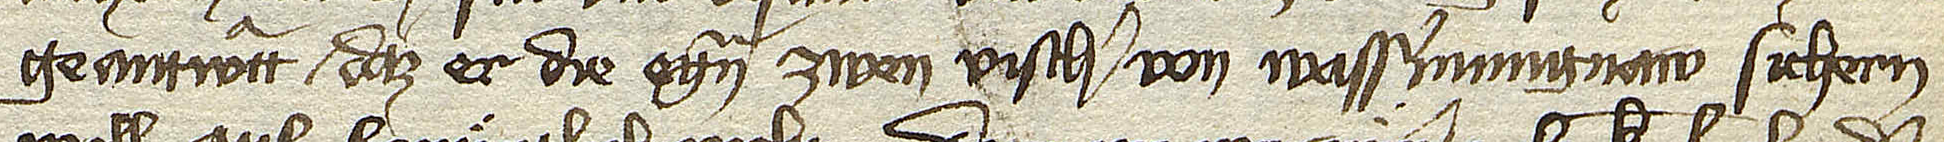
geantwtt* / daʒ er die egn* ʒwen viſch* von waſſ*mungnaw ſichern
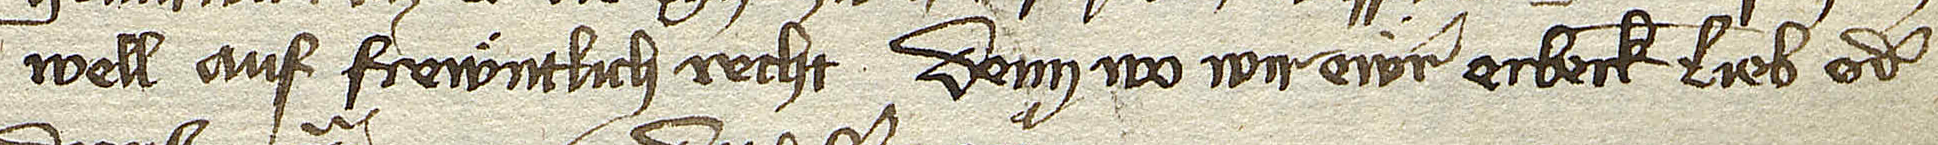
well auf freẅntlich recht Denn wo wir eẅr* erberk* lieb od*
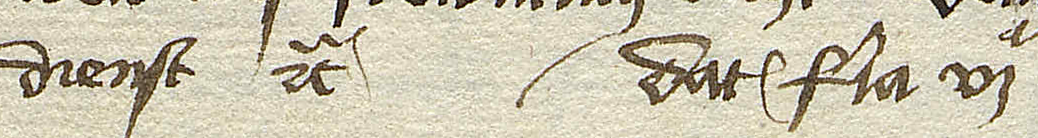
dienſt ec* / Dat* f*ia vi*
